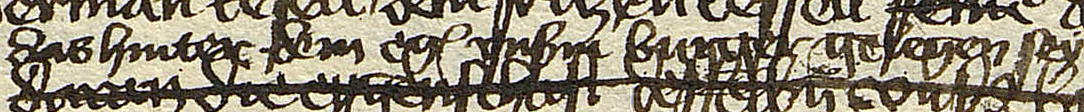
das hinter dem eg* vnſ*m burger gelegen ſey
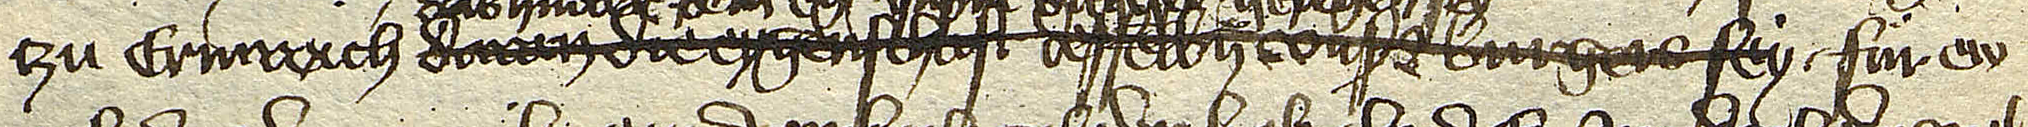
cʒu Ermreich daran die eygenſchaft deſſelbn* vnſ*s burgers ſey / für ew
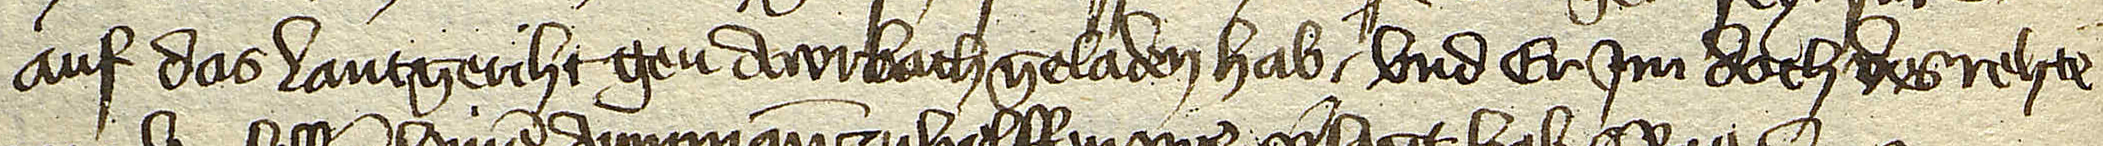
auf das Lantgeriht gen Awrbach geladen hab / vnd Er Im doch des rehte*
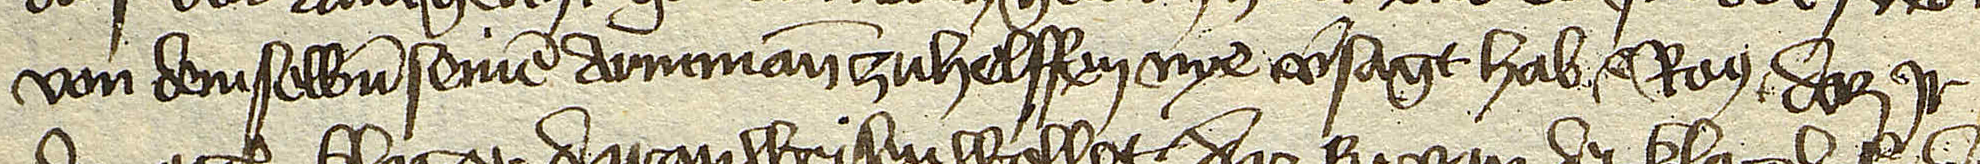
von demſelbn* ſeine* Armman* cʒuhelffen nye v*ſagt hab / Ro* / daʒ Ir
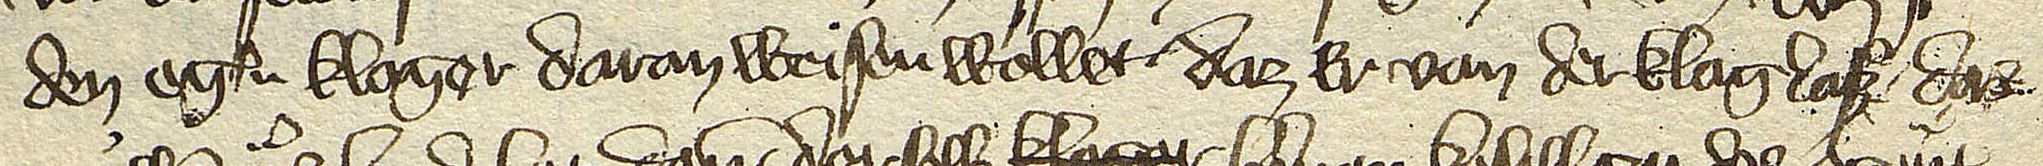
den eg* ~ klager daran weiſen wollet / daʒ Er von der klag laſʒ / dar*
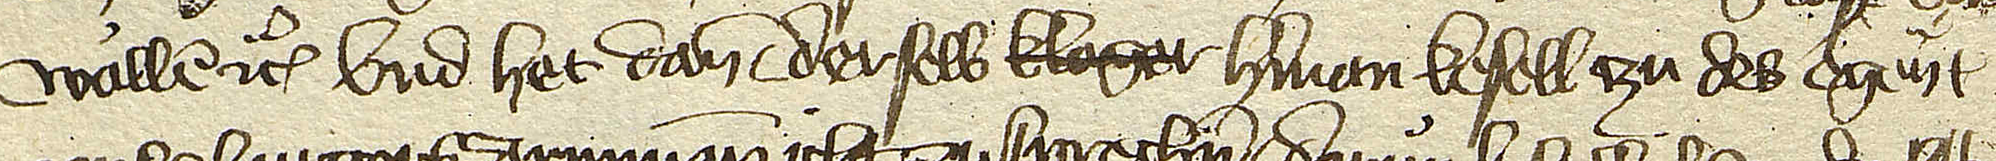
wölle* ec* vnd het dan* / derſelb klager h*man keſell cʒu des egent*
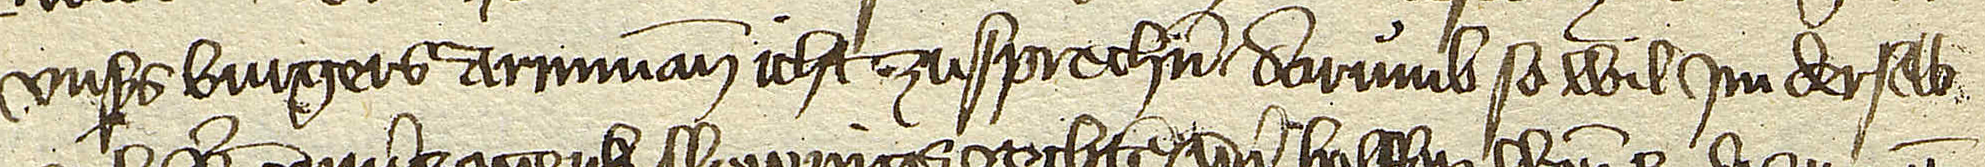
vnſ*s burgers Armman* icht cʒuſprechn* / darümb ſo wil Im derſelb
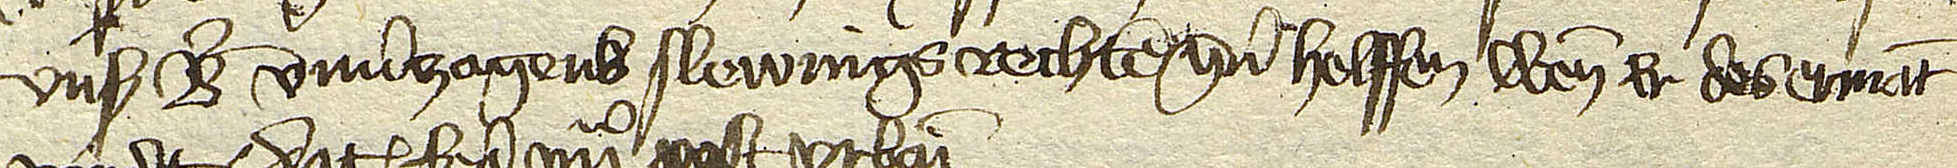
vnſ* B* vnu*cʒogens ſlewnigs rechte* gn* helffen wen* Er des ermat*
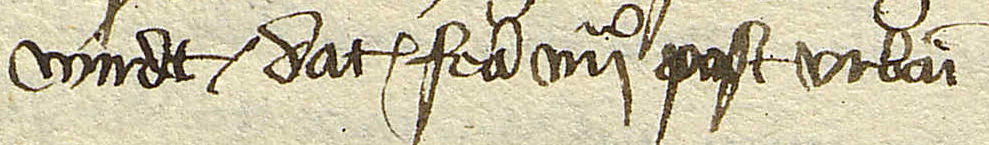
wirdt / dat* fea* iiii* poſt vrbai*
